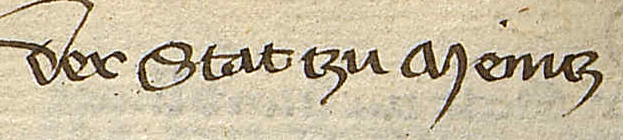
Der Stat cʒu Meincʒ
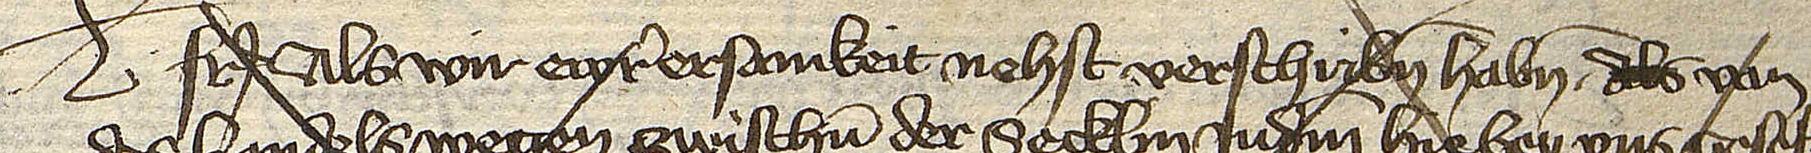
L* fr* / Als wir ewr* erſamkeit nehſt verſchribn* habn* / Als von
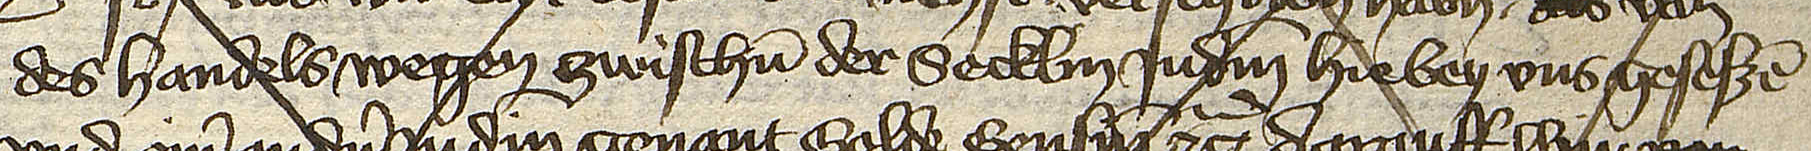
des handels wegen cʒwiſchn* der Secklin Iudin* hie bey vns geſeſʒe*
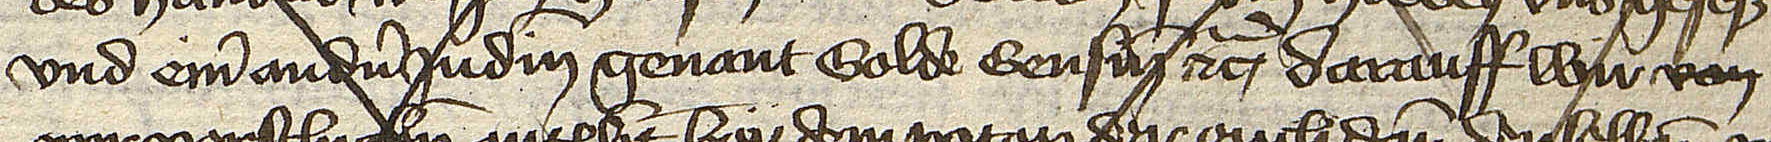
vnd ein* andn* Iudin* genant Golde Genſin* ec* / darauff wir von
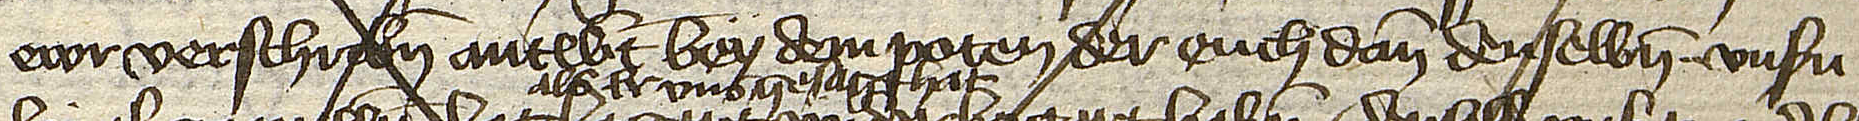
ewr verſchribn* antw*t bey dem poten der euch dan* denſelbn* ~ vnſ*n
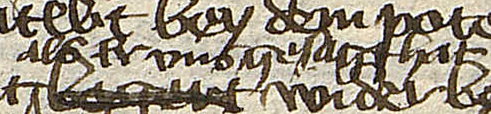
als Er vns geſagt hat
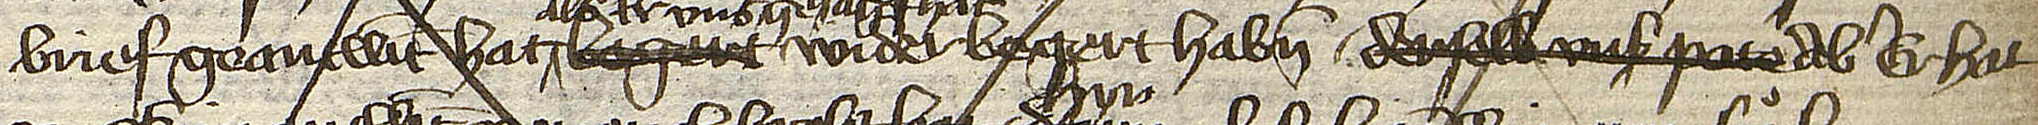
brief geantw*t hat begert wider begert habn* / derſelb vnſ* pote Ab* Er hat
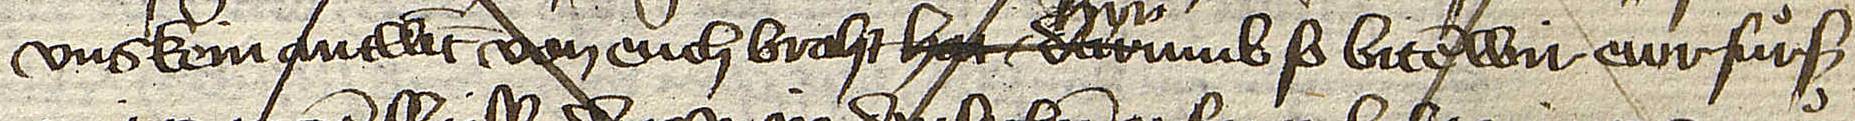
vns kein antw*t von euch braht hat / darumb ſo bite* wir ewr fürſ*
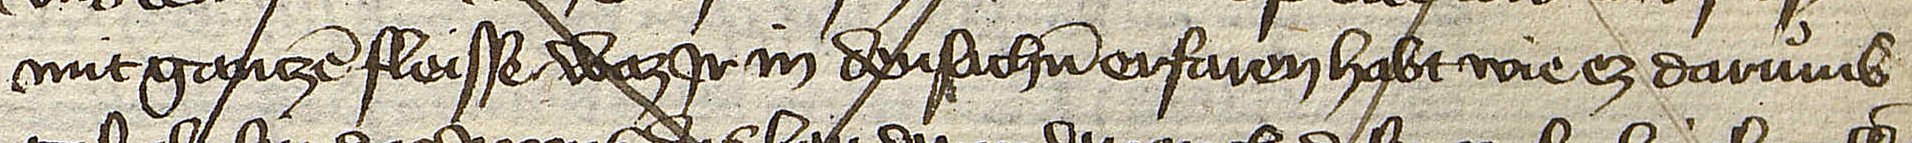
mit gancʒe* fleiſſe / waʒ Ir in den ſachn* erfaren habt wie eʒ darümb
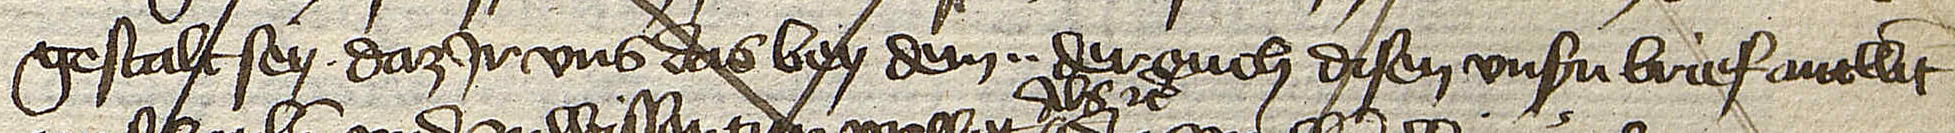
geſtalt ſey . daʒ Ir vns das bey dem ~ der euch diſen vnſ*n brief antw*t
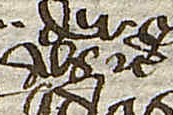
Als ec*
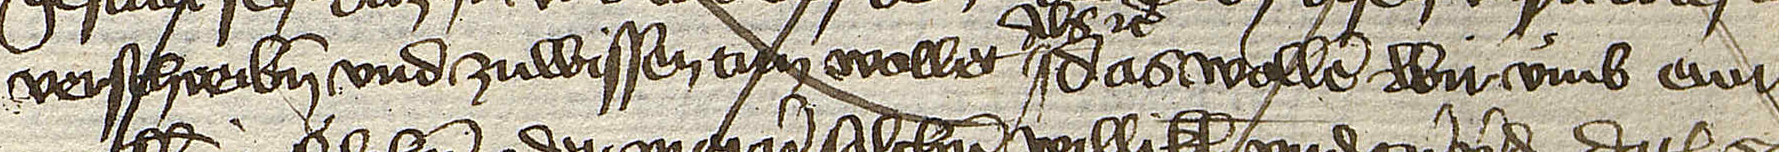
verſchreibn* vnd ʒuwiſſen tun wollet das wolle* wir v̈mb ewr
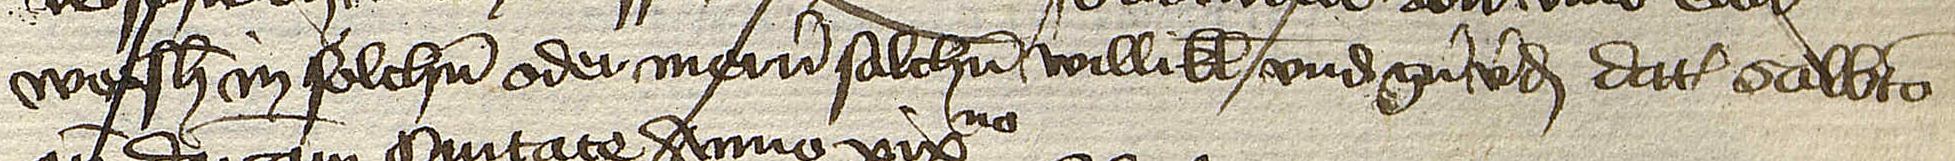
weiſh* in ſölchn* oder mern* ſolchn* willikl* vnd gn* v*d* dat* Sabbto*
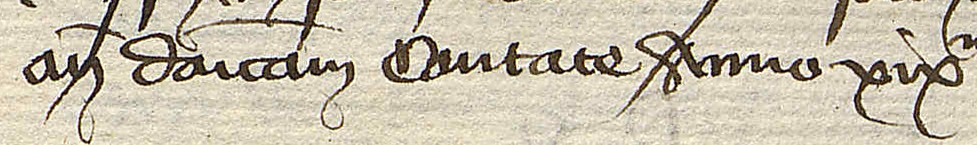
an* doicam* Cantate Anno xix*
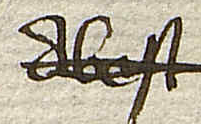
Abeſt
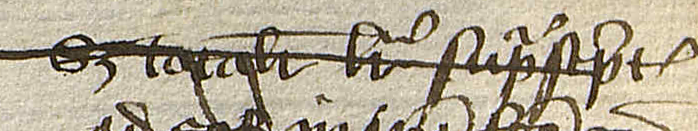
% totalr* lr* ſup*ſc*pt*
